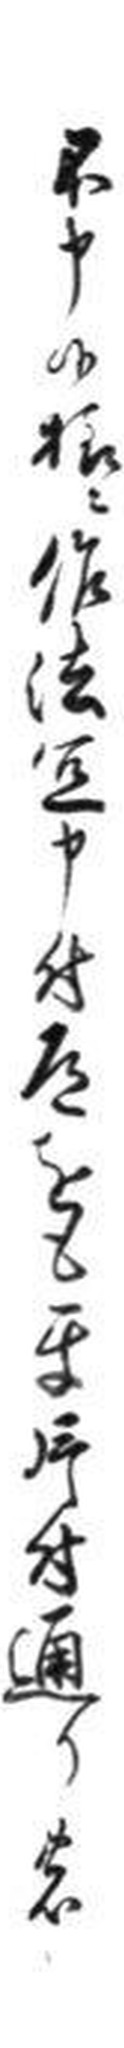不申候様ニ作法宜申付道をもたｇ片付通り者
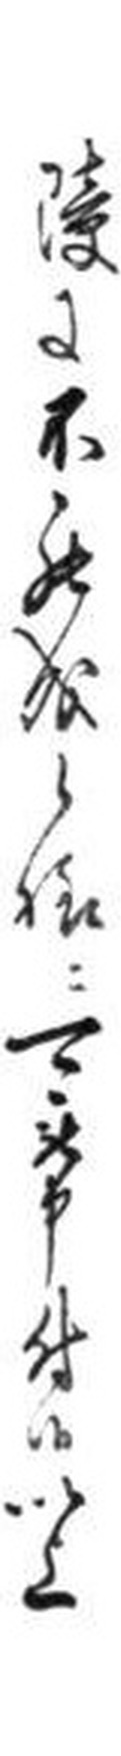障に不罷成候様ニ可被申付候以上
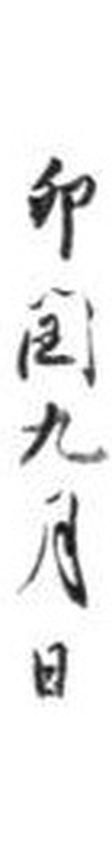卯閏九月日
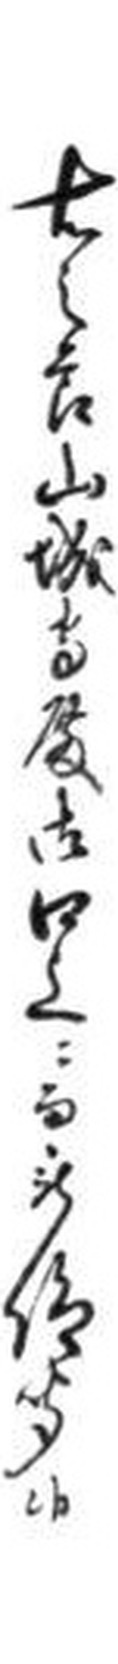右之節山城守殿御口上ニ而被仰聞候
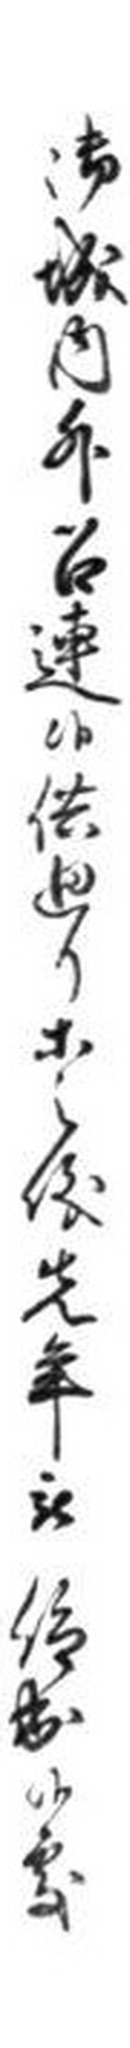御城内外召連候供廻り等之儀先年被仰出候処
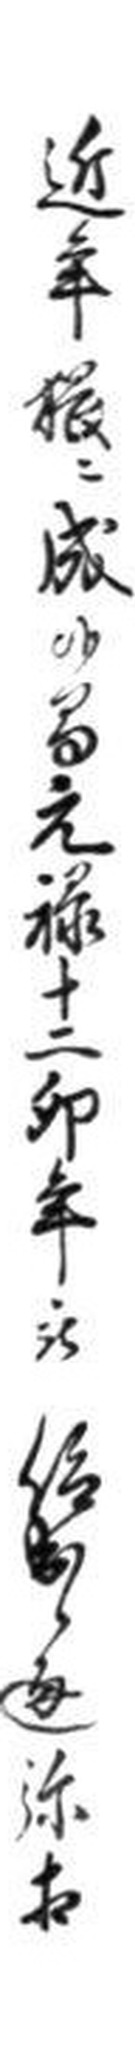近年猥ニ成候間元禄十二卯年被仰出候通弥相
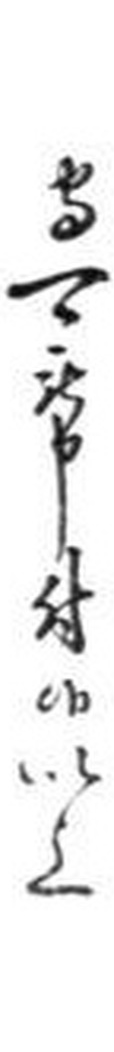守可被申付候以上
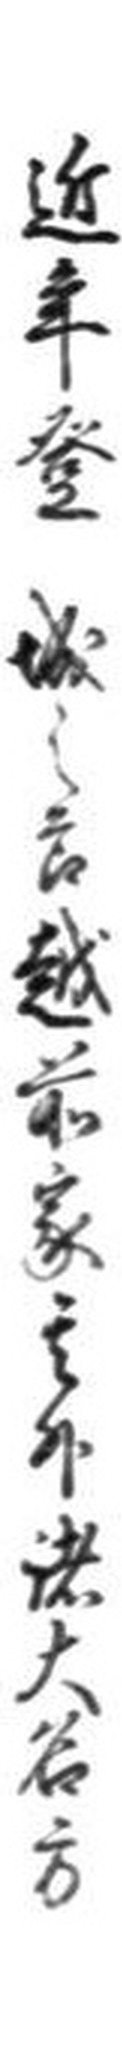近年登城之節越前家其外諸大名方
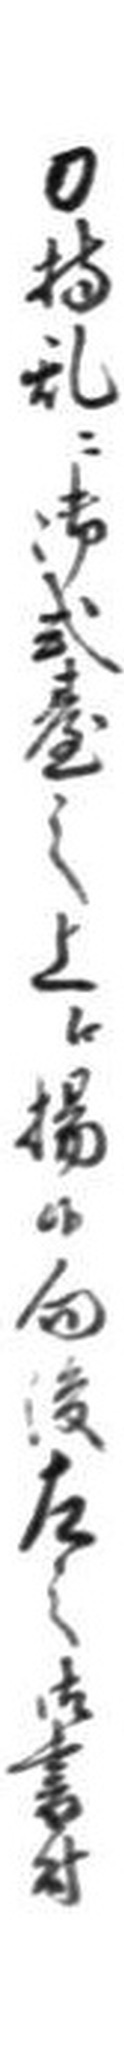刀持乱ニ御式台之上江揚候向後左之御書付
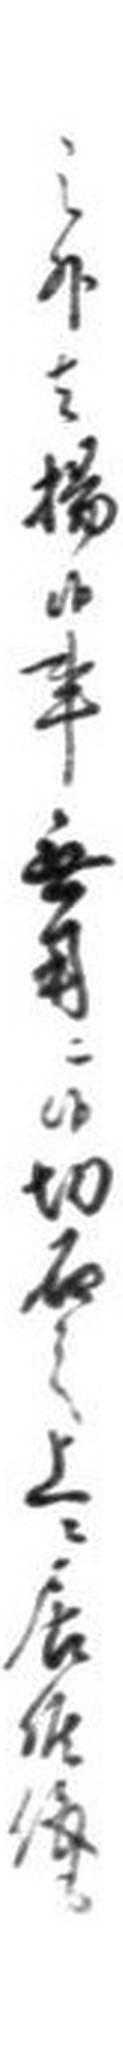之外者揚候事無用ニ候切石之上ニ居候儀も
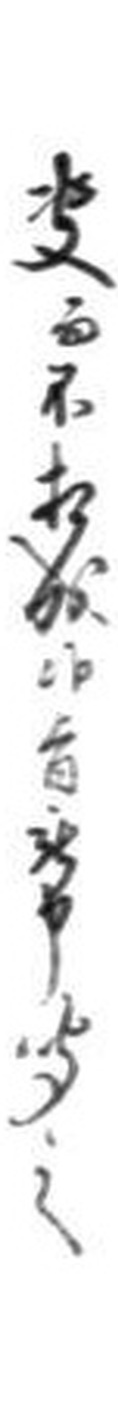決而不相成候旨被申聞之
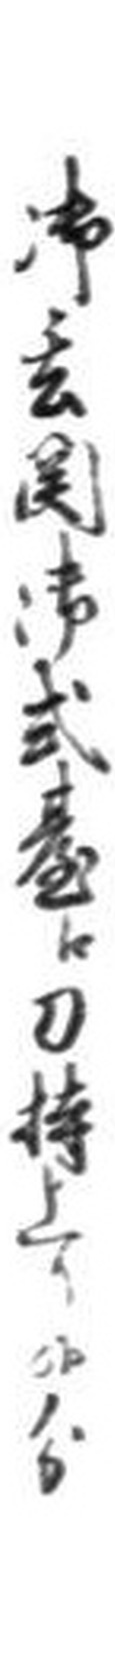御玄関式台江刀持上り候分

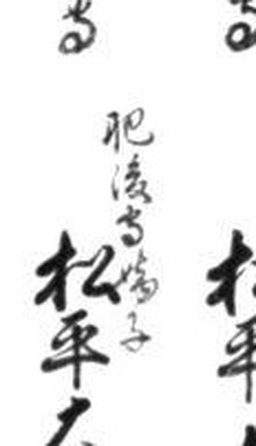肥後守嫡子
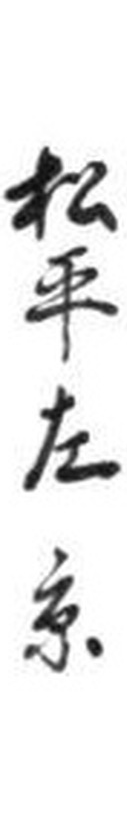松平左京
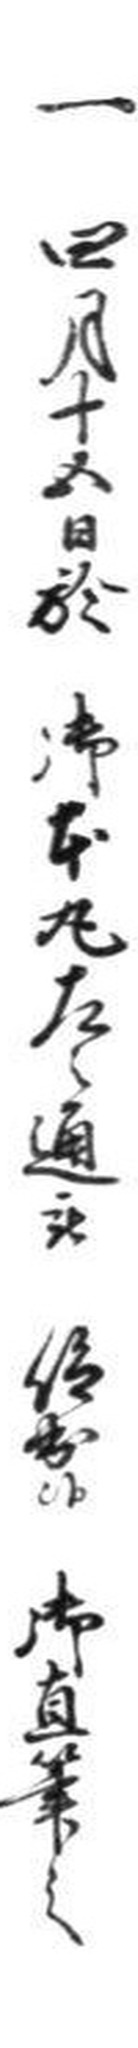一四月十五日於御本丸左之通被仰出候御直筆之
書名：家譜 三十二 吉邦公 従享保二年到享保三年
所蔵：福井県文書館 Fukui Prefectural Archives
